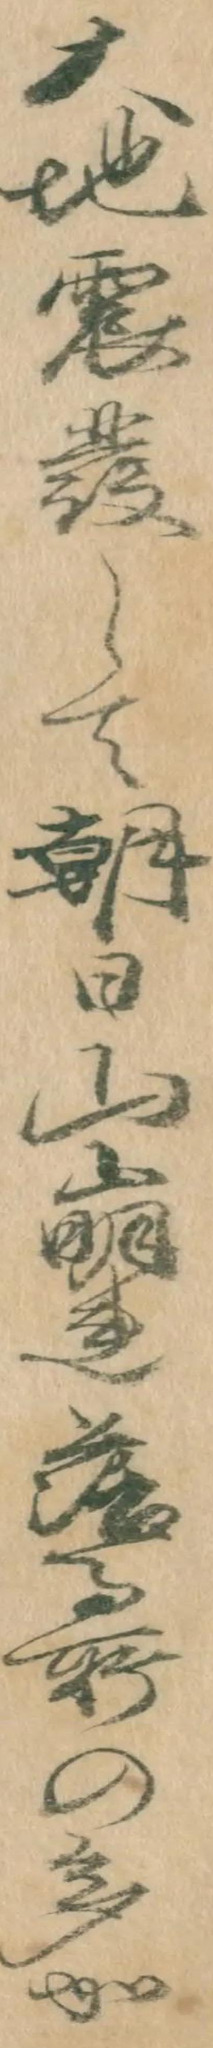大地震発して朝日山崩れ落る所の多か
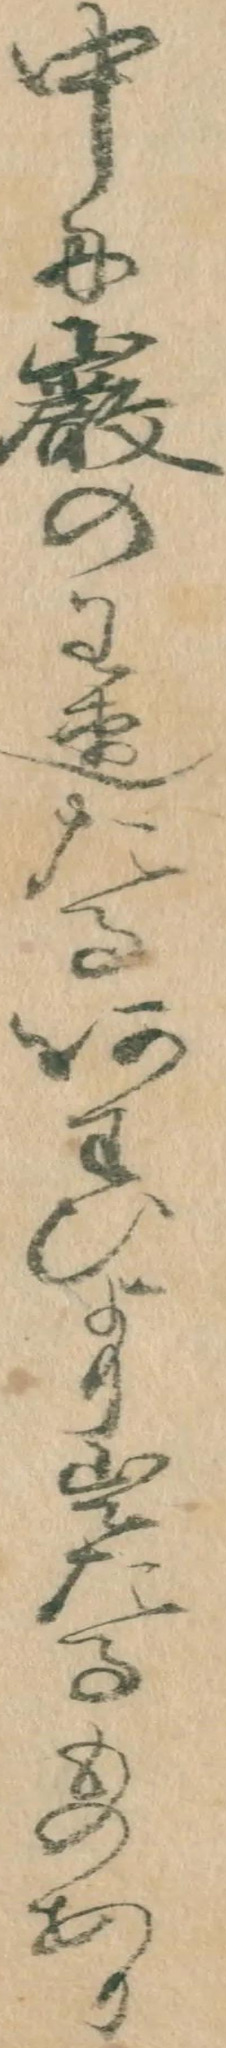中に巌のわれたるあわひより出たるものあり
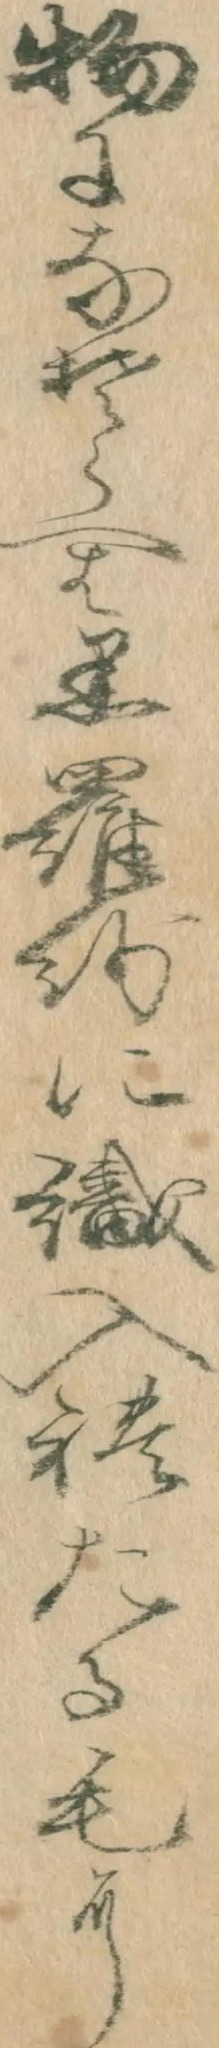物になそらへは黒羅紗に織入れたる毛に
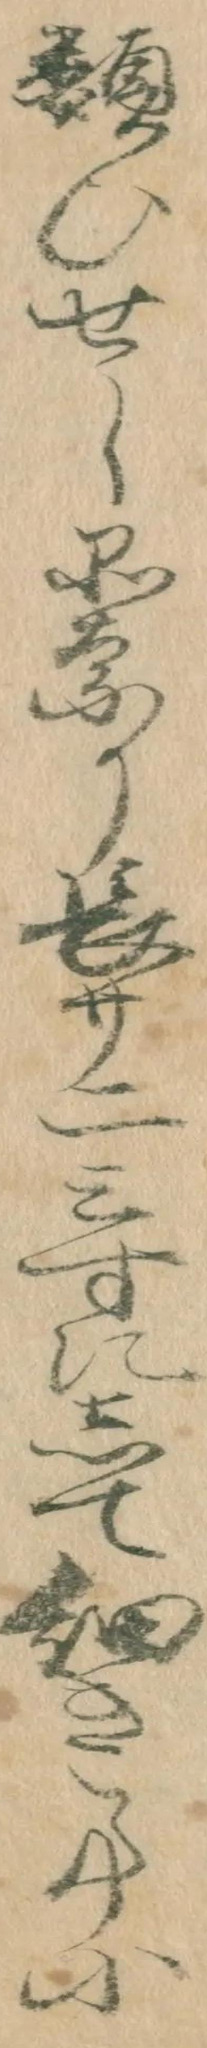類ひせし品なり長サ二三寸にして細き事に小
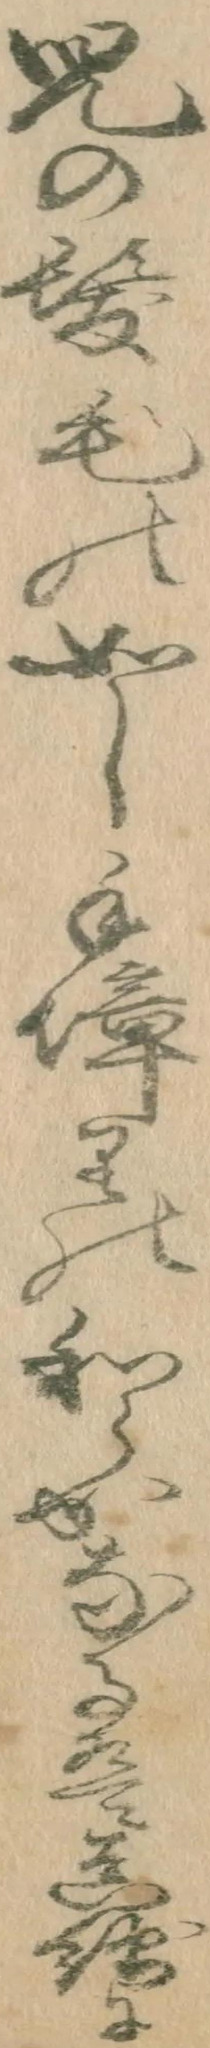児の髪毛の如し手障りの和らかなるは真綿に
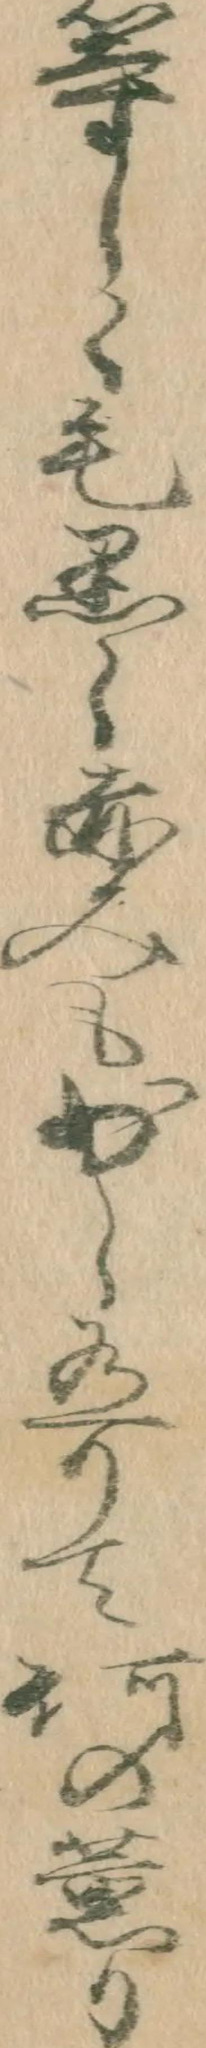等しく毛黒く赤みも少し有りて何の薫り
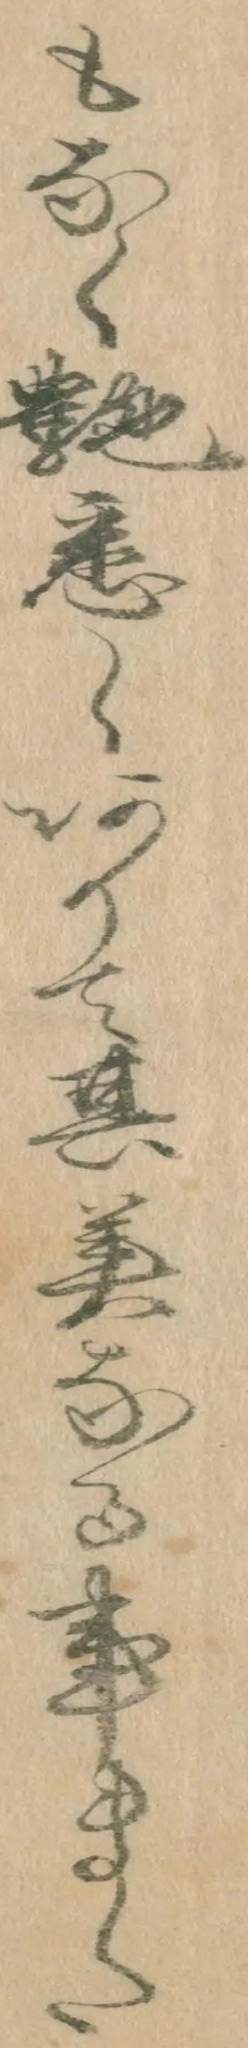もなく艶悉くありて其美なる事また
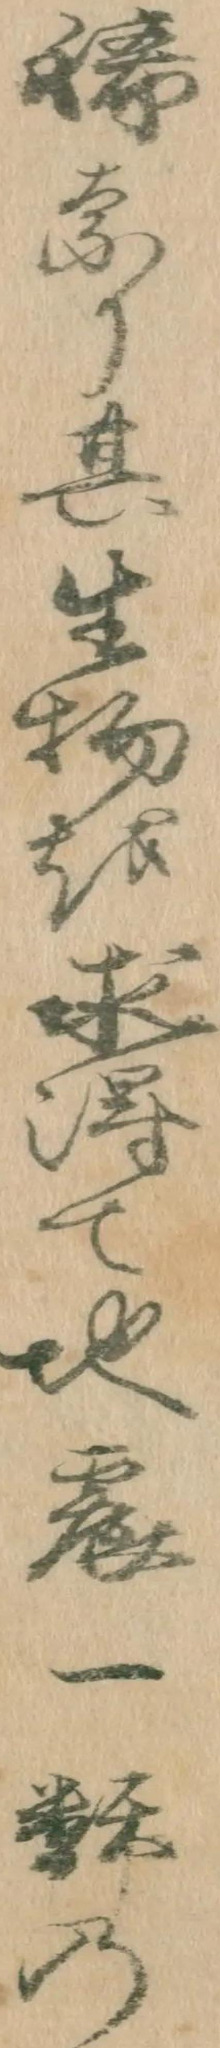稀なり其生物を求得て地震一類？の
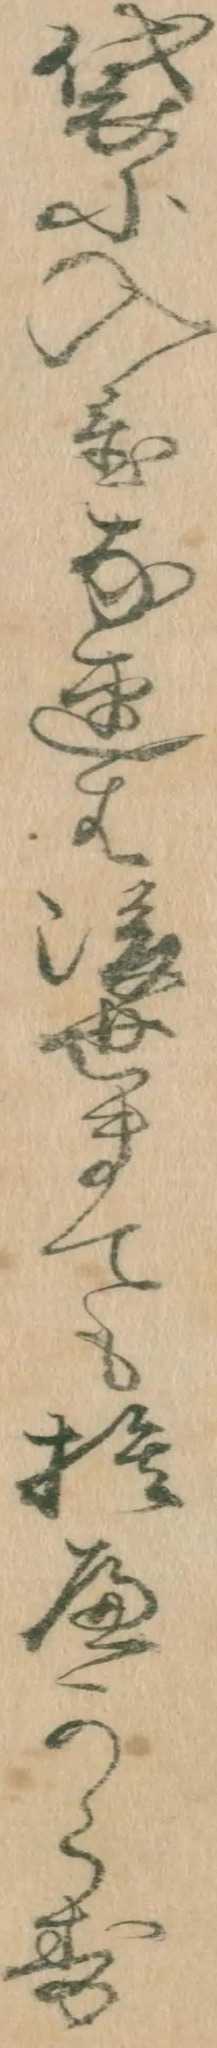袋に入置なれは渡世まても捨へからす
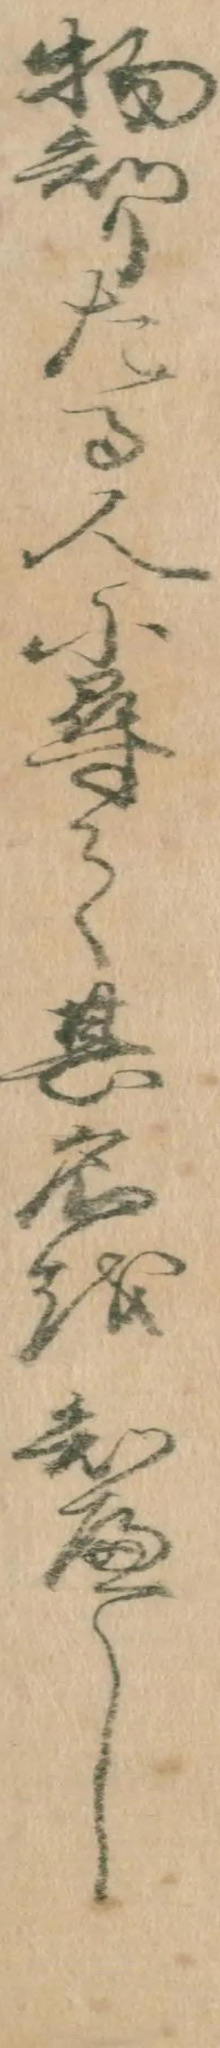物知りたる人に尋て其名を知へし
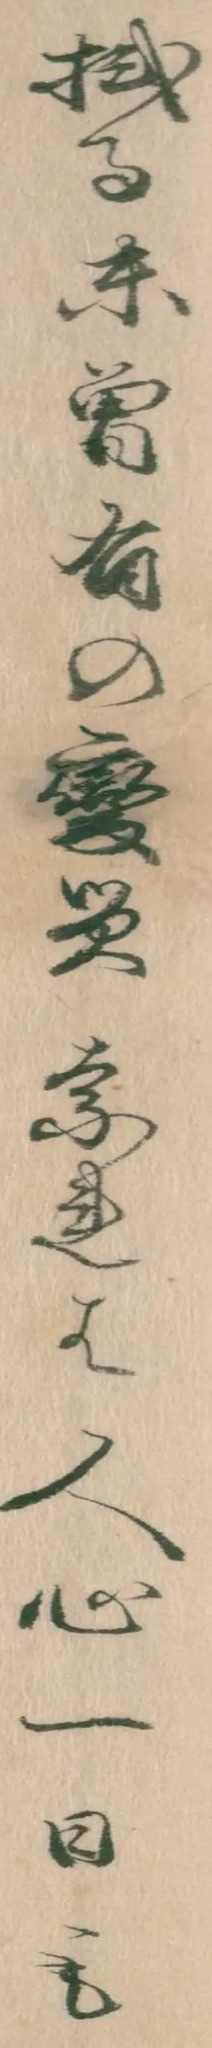掛る未曾有の変災なれは人心一日も
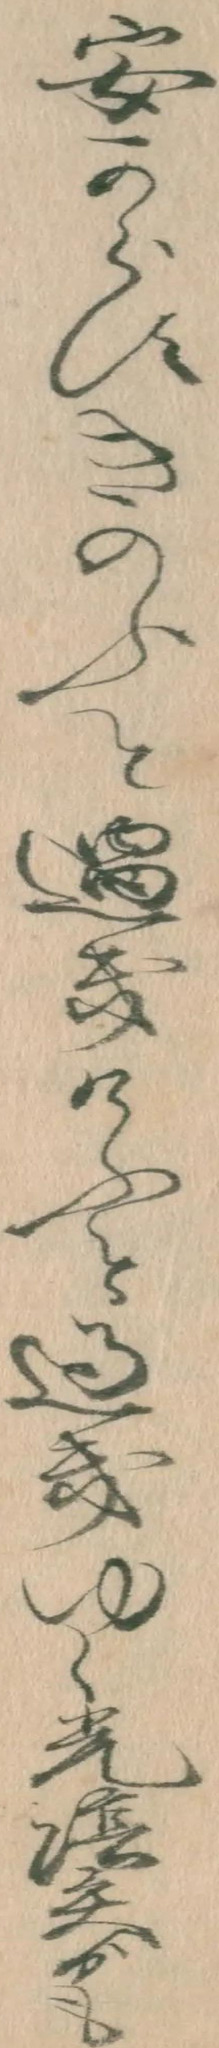安からすきのふと過きけふと過きゆく光陰矢ゟも
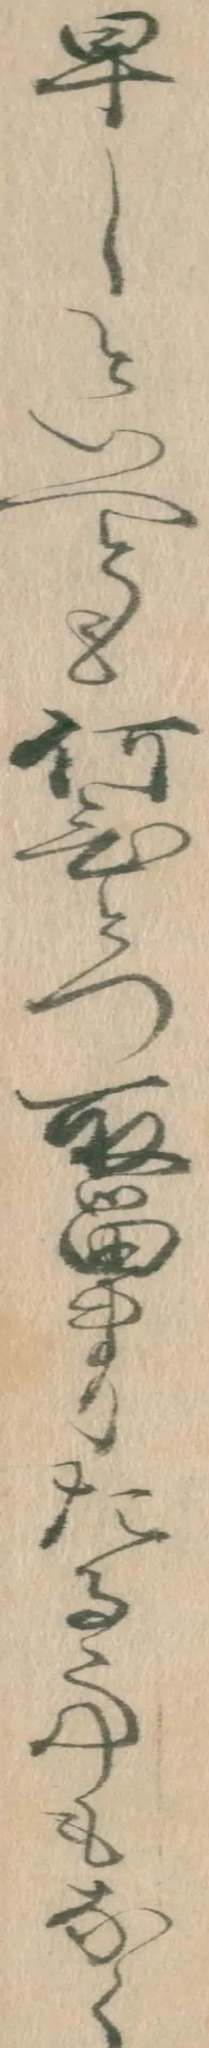早しといへとも何ひとつ取留まりたる事もなく
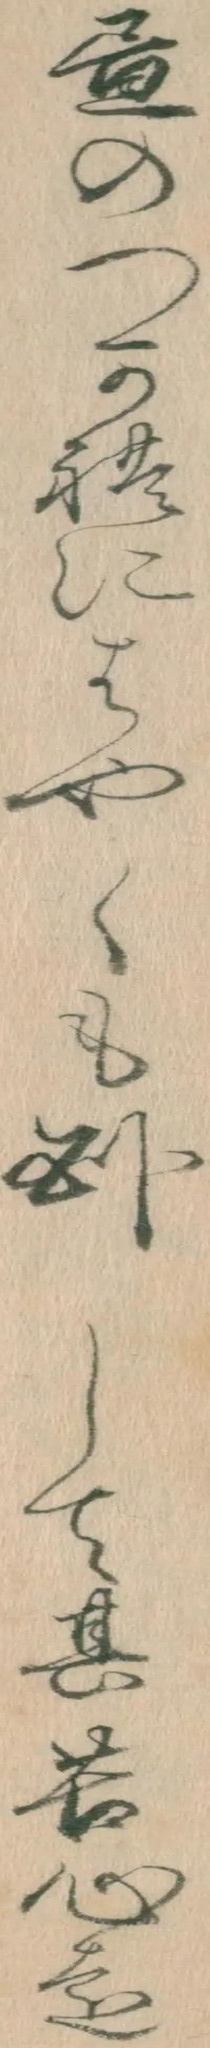昼のつかれにはやくも臥して其苦心を
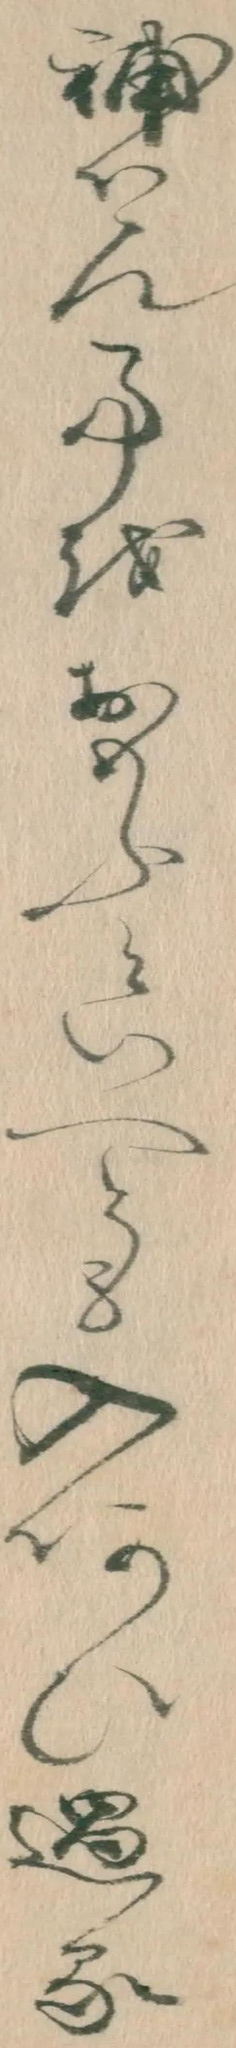補はん事をおもふといへとも入あひ過る
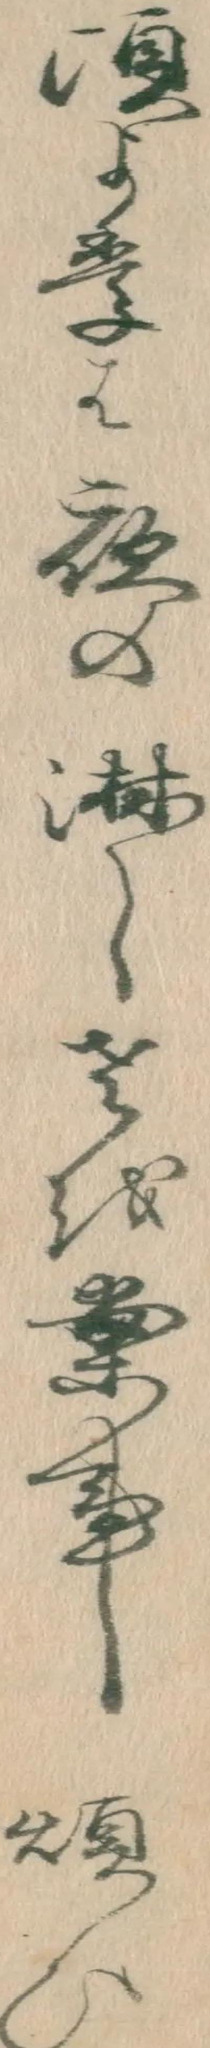頃よりは夜の淋しさを案事煩ひ
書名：俗語之種. [6]
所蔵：国立国会図書館 National Diet Library, JAPAN
